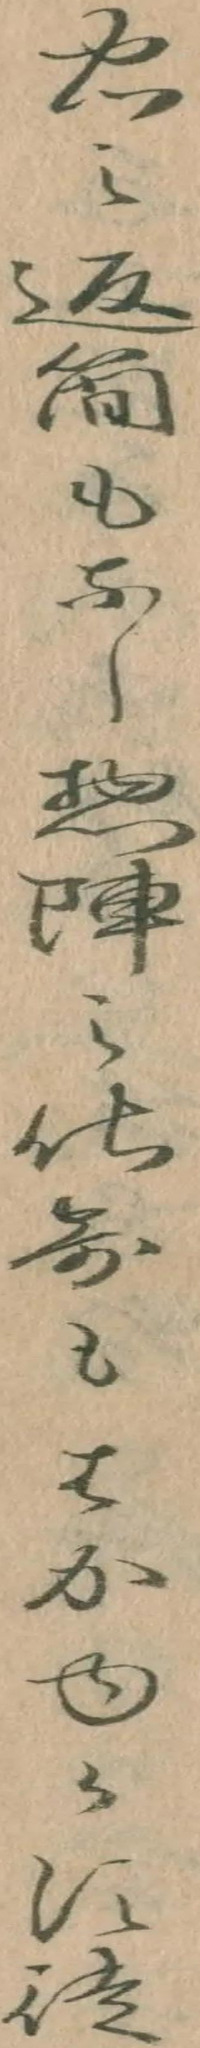忠之返筒もなし惣陣之仕寄もはかゆか須徒
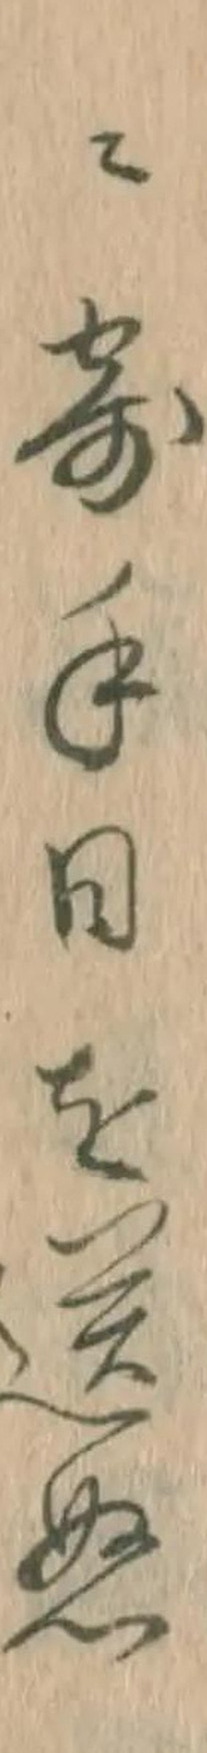に寄手日を送怒
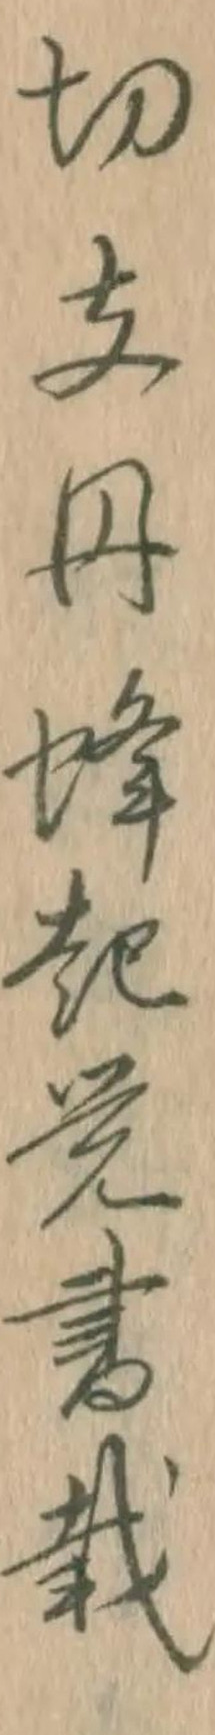切支丹蜂起覚書載
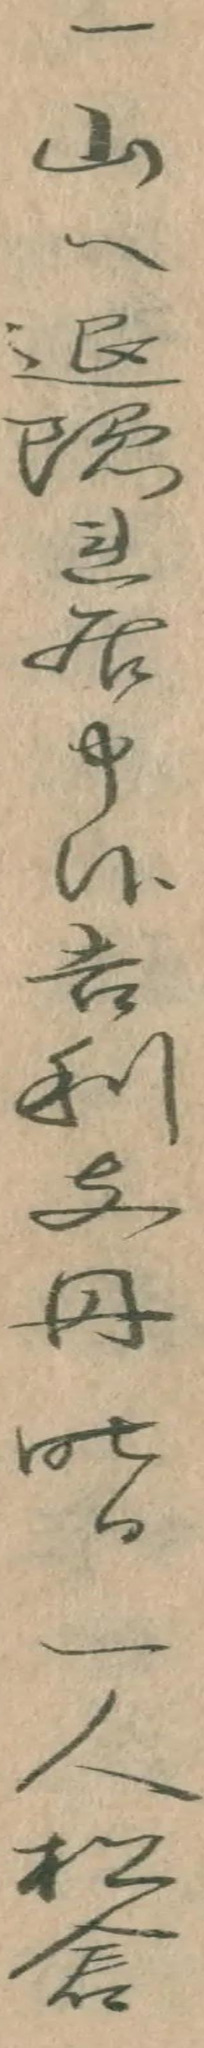一山へ退隠連居申候吉利支丹昨日一人松倉
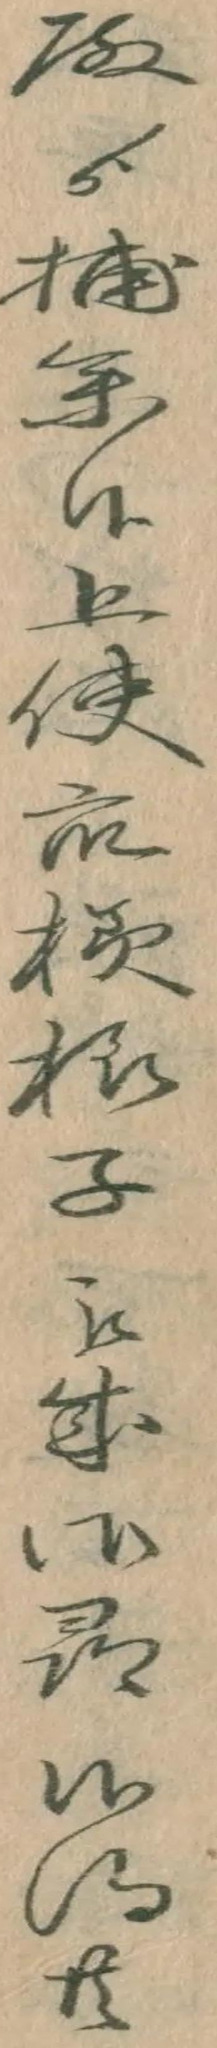殿ゟ捕参候上使衆様様子被成御尋候得共
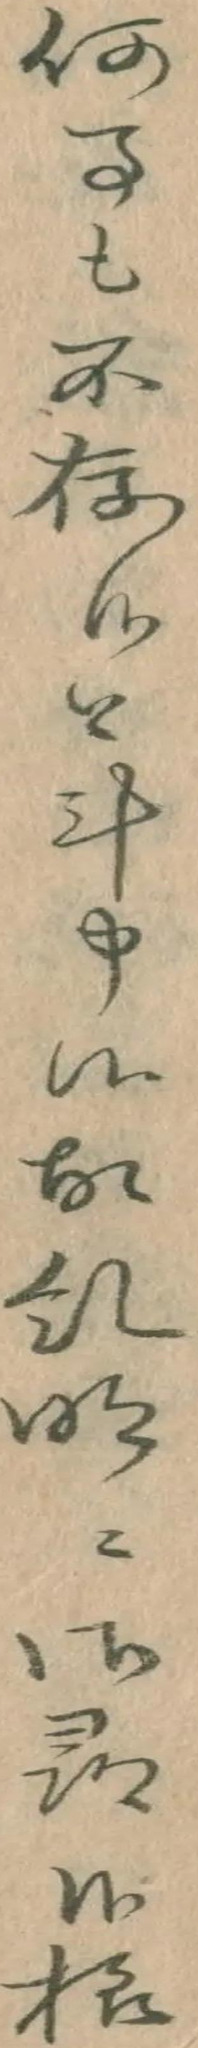何事も不存候と斗申候故糾明に御尋候様
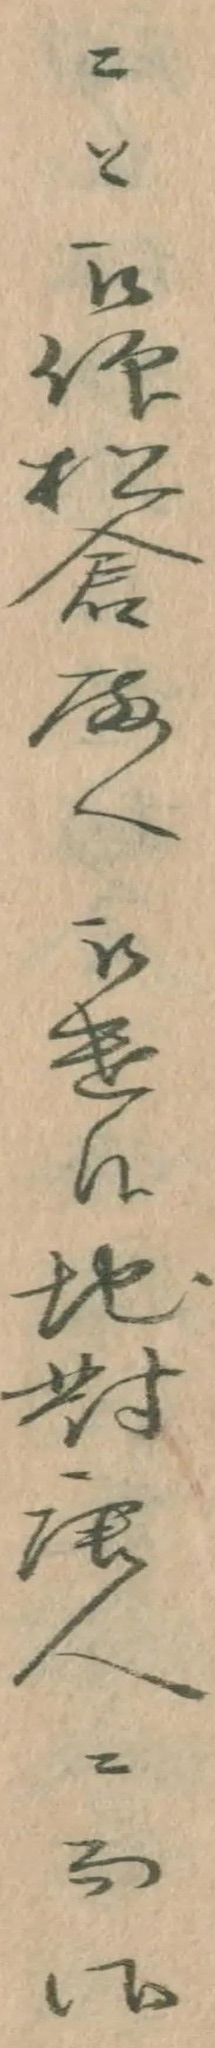にと被仰松倉殿へ被遣候地對浪人に而御

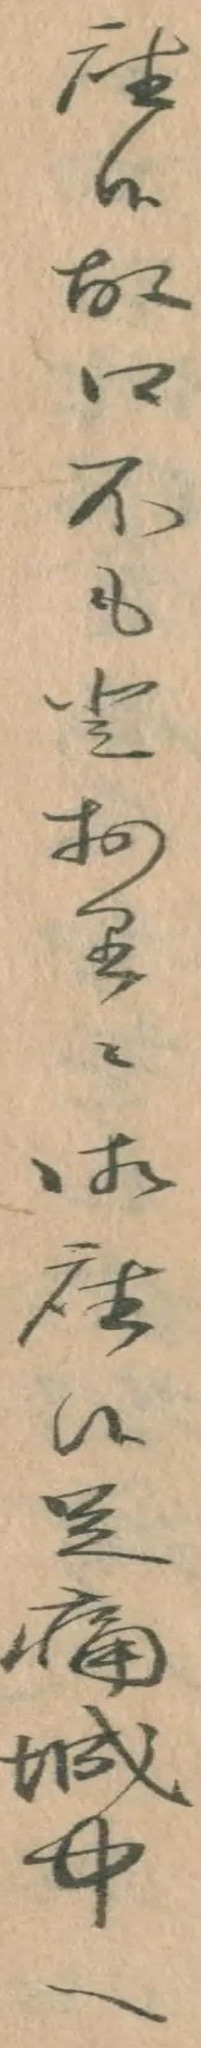座候故口不も登お里に御座候足痛城中へ
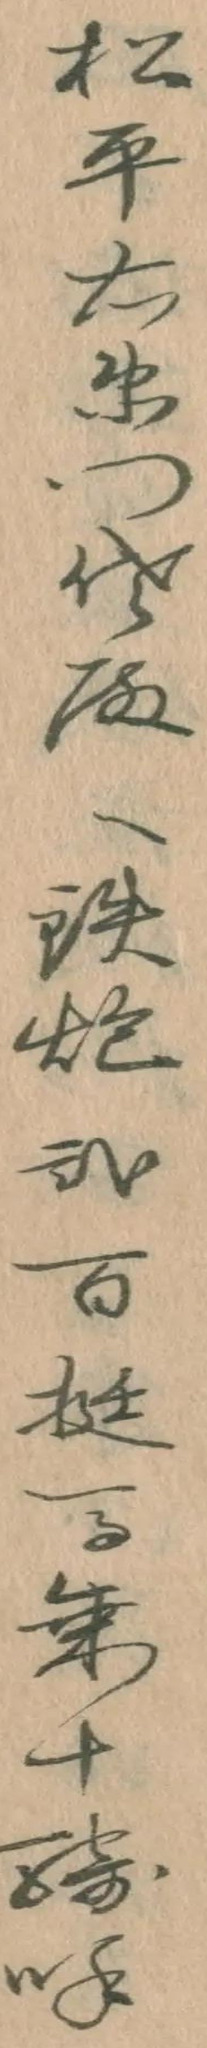一松平右衛門佐殿へ鉄砲弐百挺馬乗十騎呼
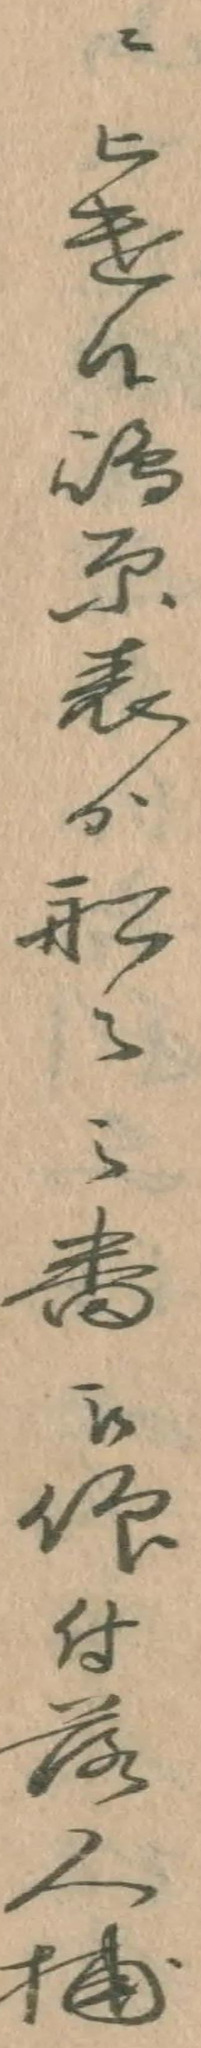に被遣候島原表ゟ舩々之番被仰付落人捕
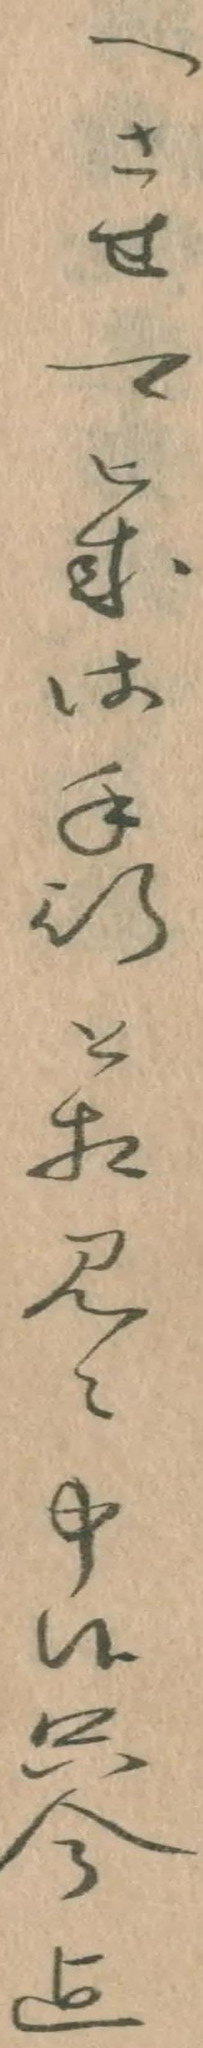へさせ可被成御手行と相見に申候只今迄
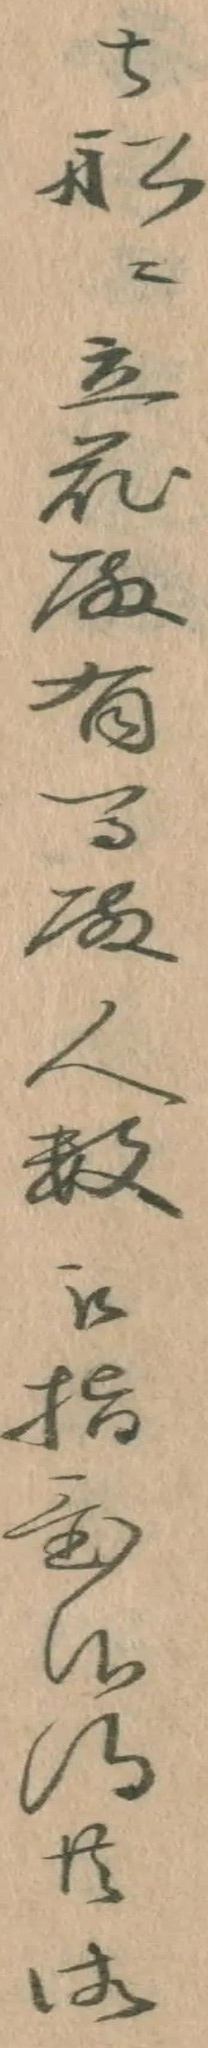者舩に立花殿有馬殿人数被指置候得共御
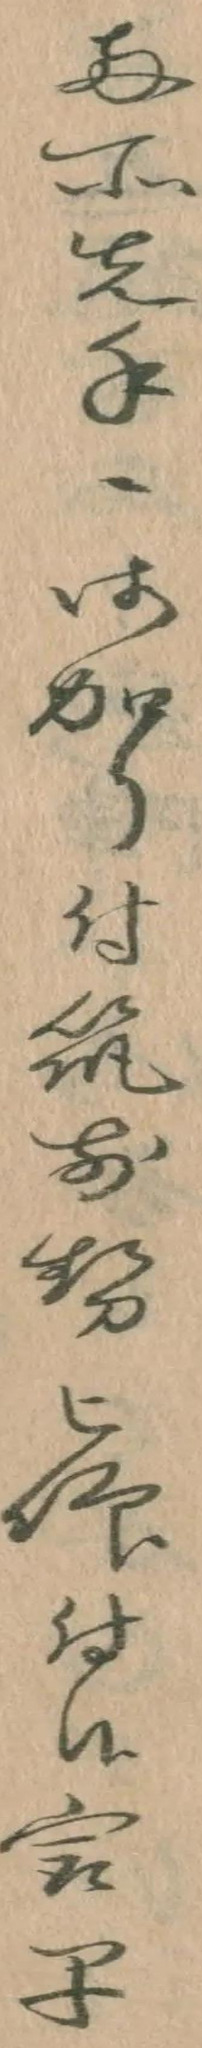両所先手に御加り付筑前勢被仰付候最早
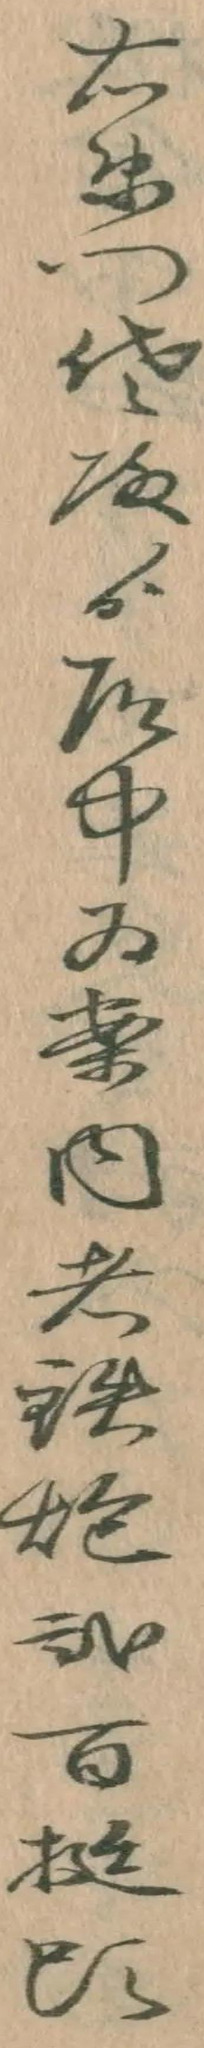右衛門佐殿ゟ道中ゐ案内者鉄炮弐百挺頭
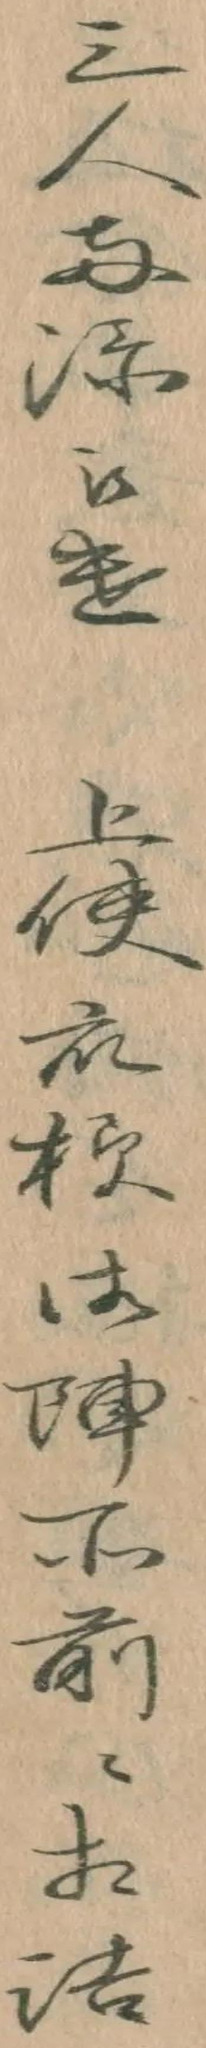三人両添被遣上使衆様御陣所前に相詰
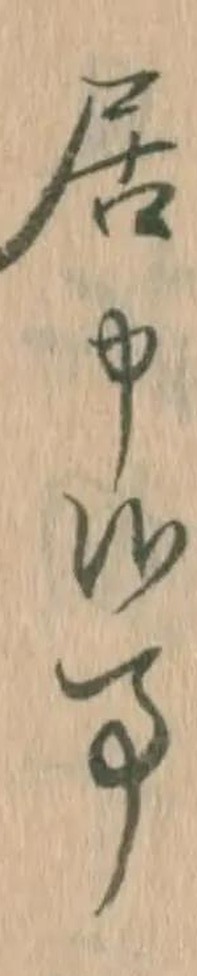居申候事
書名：切支丹御退治記 49巻. [4]
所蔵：国立国会図書館 National Diet Library, JAPAN
